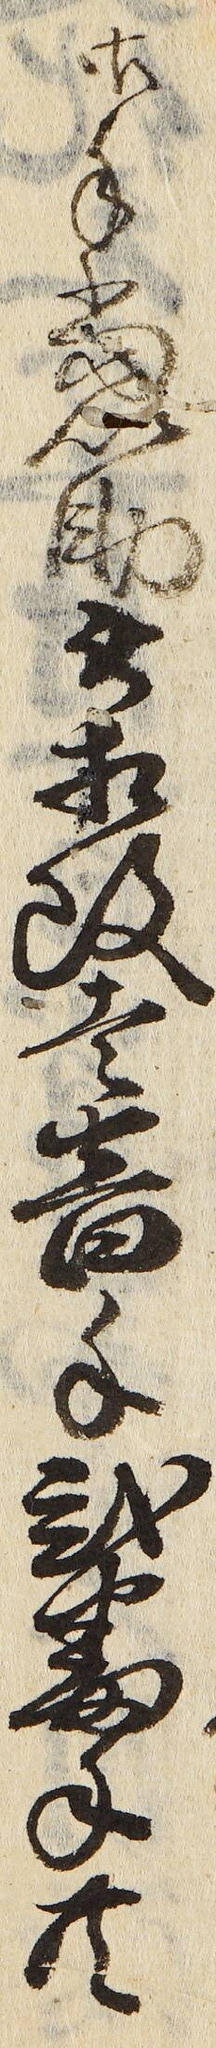御手当筋被相改壱番手弐番手共
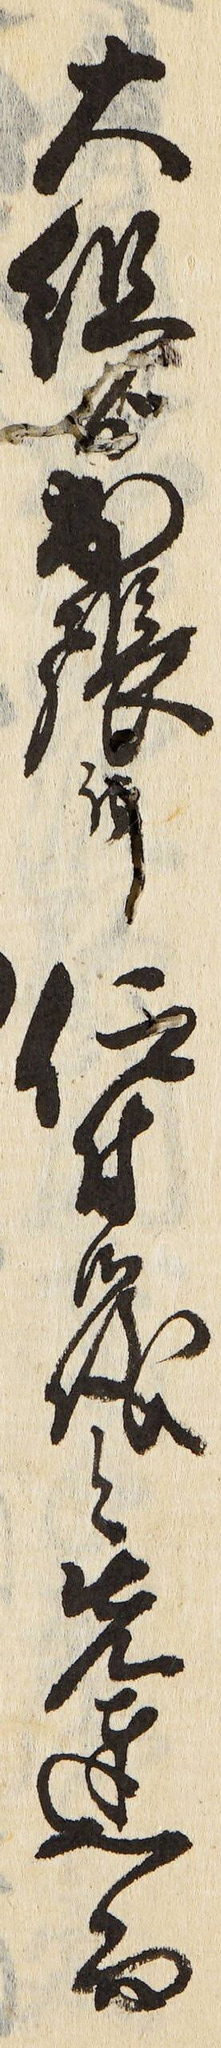大組ゟ出張被仰付候儀と先達而
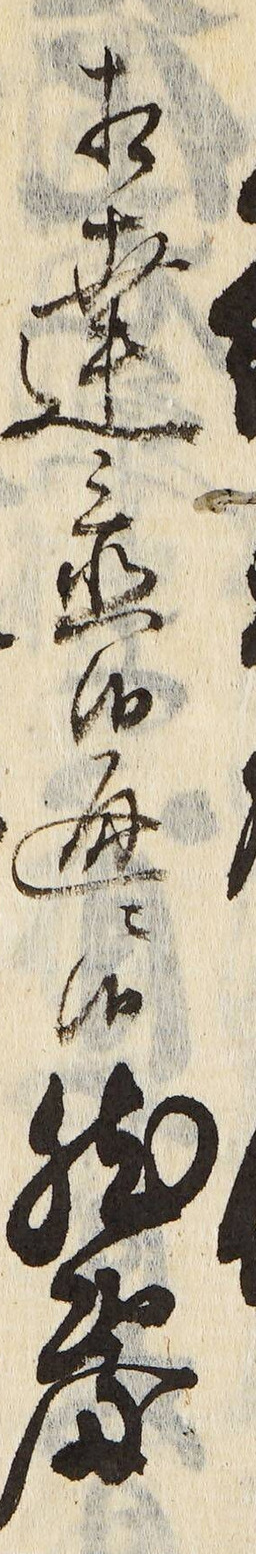相達置候通ニ候然処
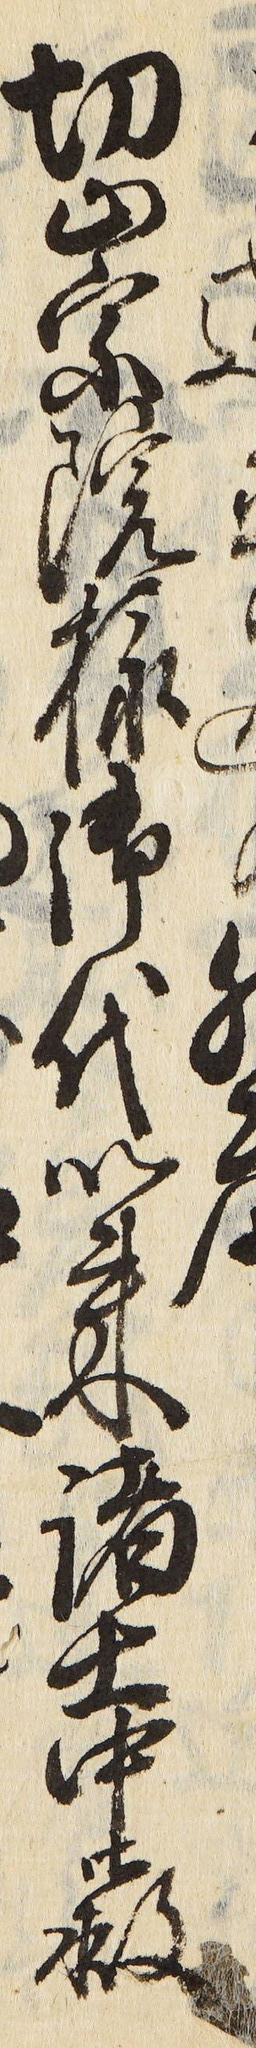切崇院様御代以来諸士中御救
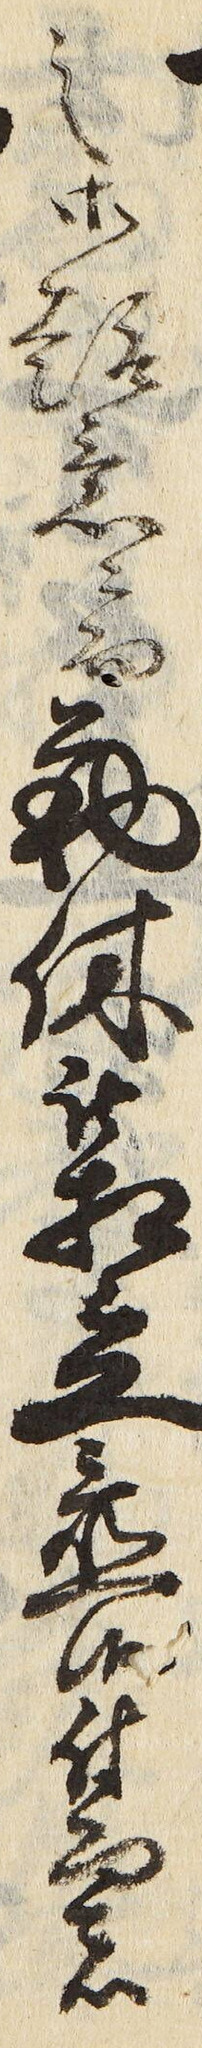之御趣意ニ而勤休被相立置候付而者
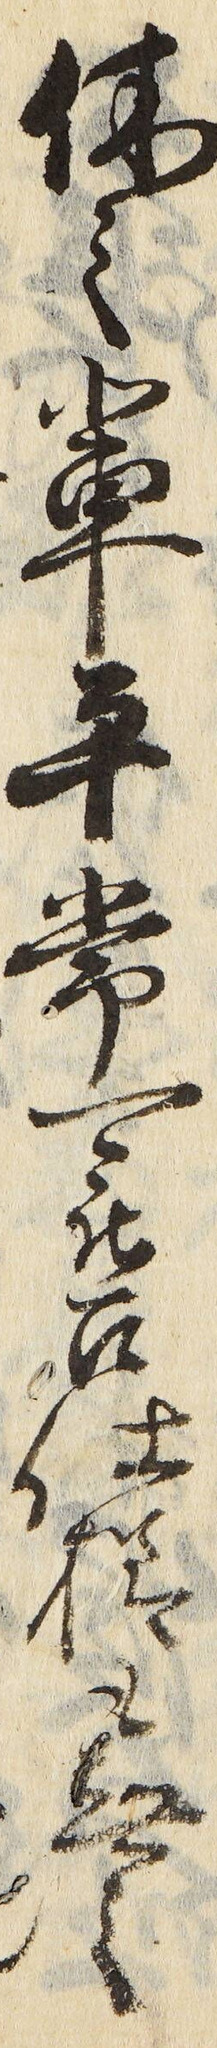休之輩平常可被召仕様も無之
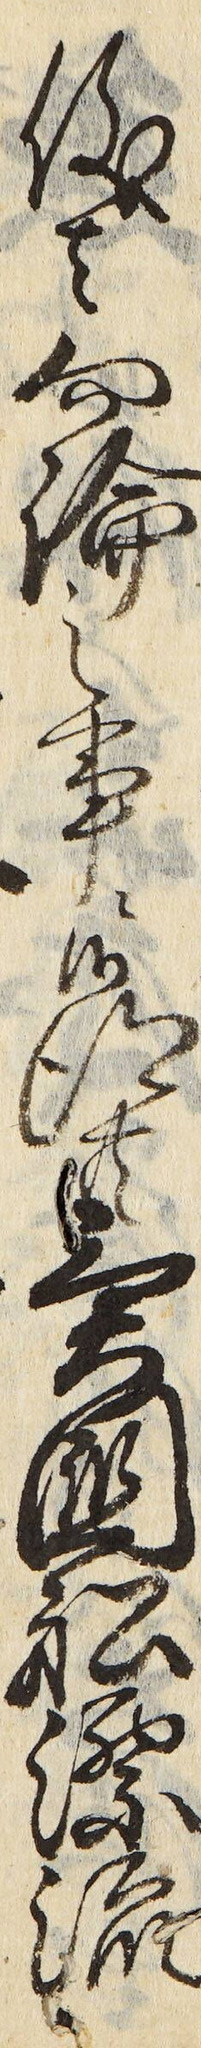儀者勿論之事ニ候得共異国船漂流
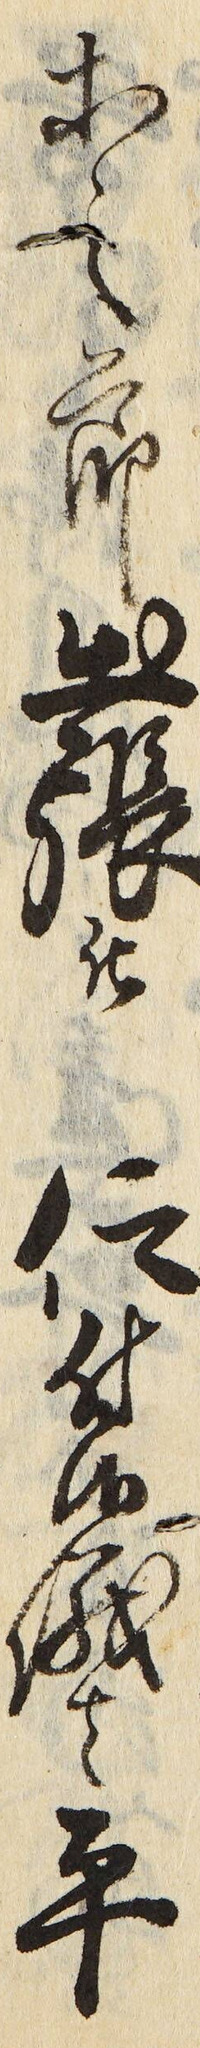等之節出張被仰付候儀者平

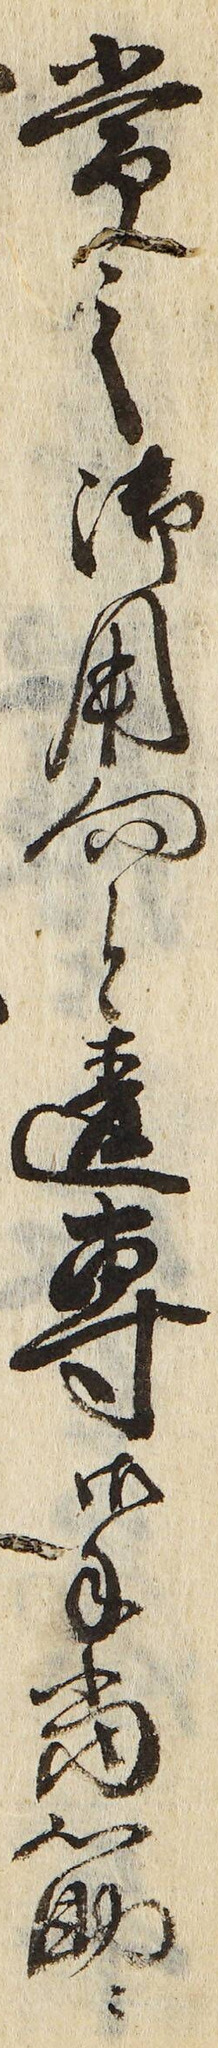常之御用向と違専御手当筋ニ
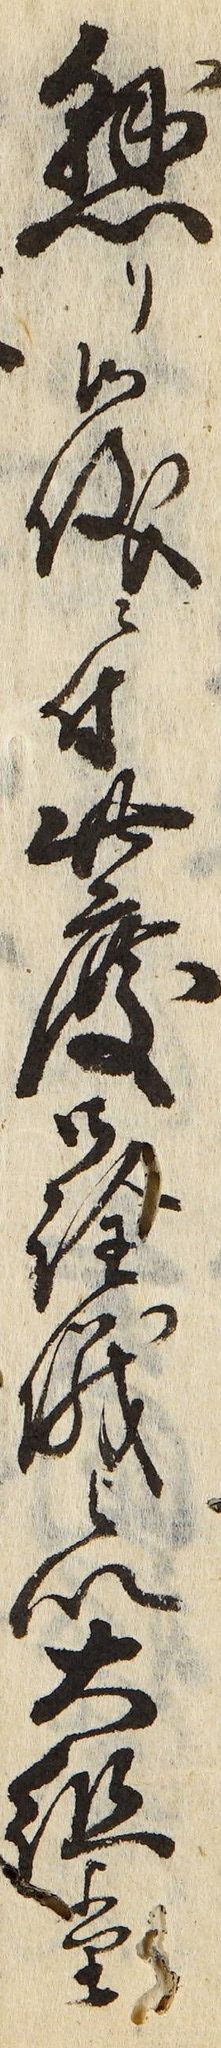懸り候儀ニ付此度御詮儀与以大組より
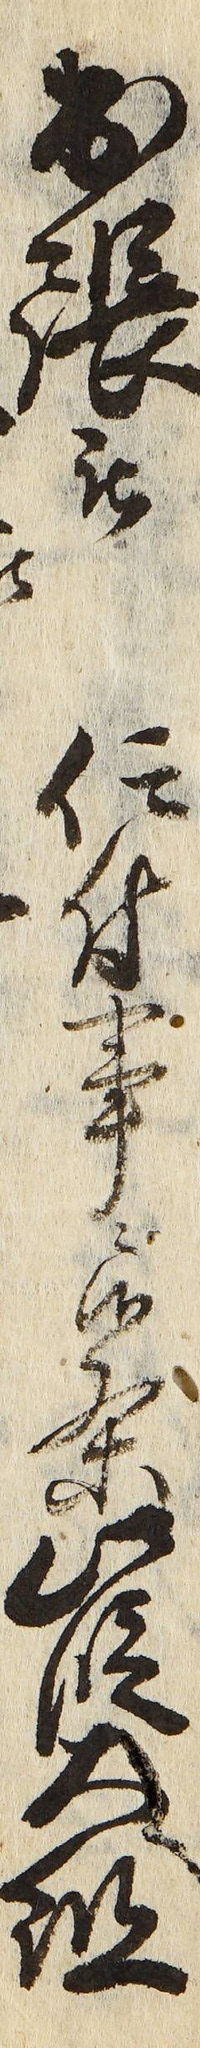出張被仰付事ニ候条此段大組
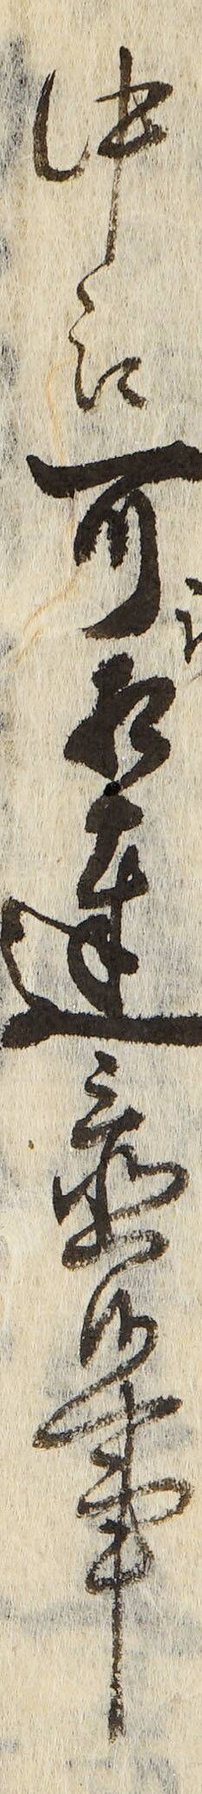中江可被相達置候事
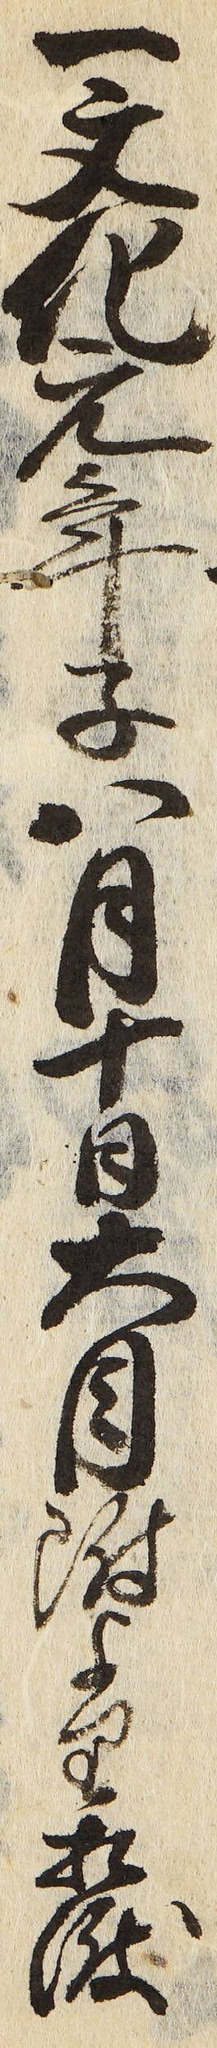一文化元年子八月十日大目付より相渡
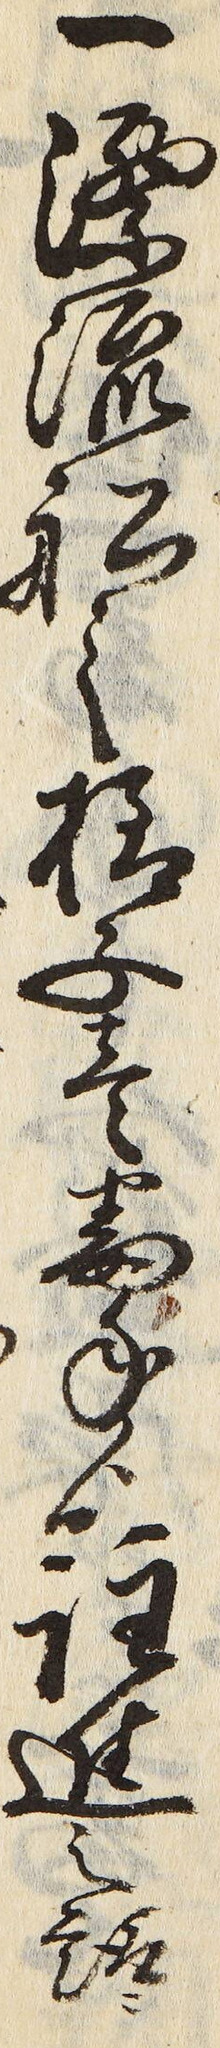一漂流船之様子壱番手ゟ注進之趣ニ
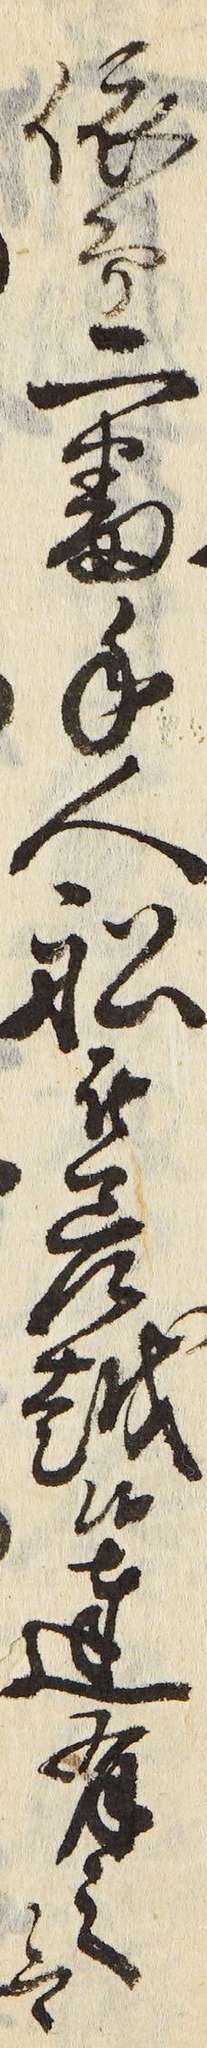依而二番手人船被差越候達有之候ハヽ
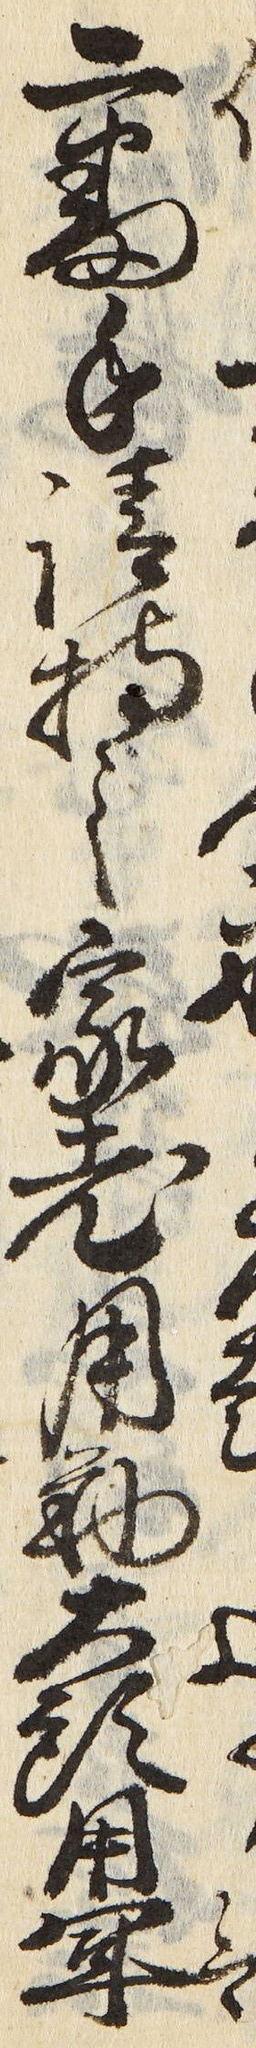二番手請持之家老用勤大頭用軍
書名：御領海江異国船漂流有之節御手当之次第大組頭心得之廉々書集記
